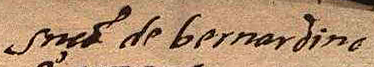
snçā de bernardino
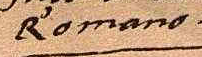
Romano
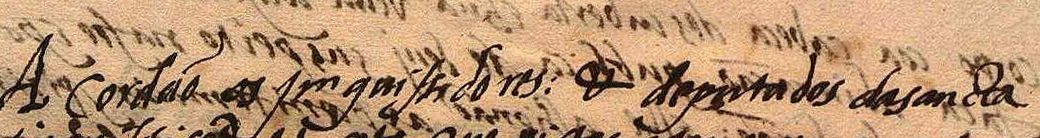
Acordaõ os jmquissidores: & deputados da sancta
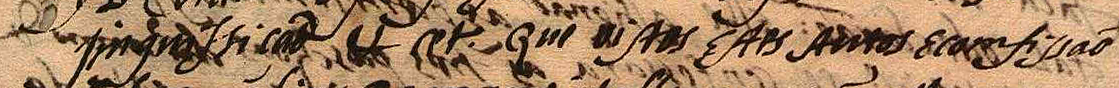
jmquissição & cet. Que vistos Estes Autos E comfissaõ
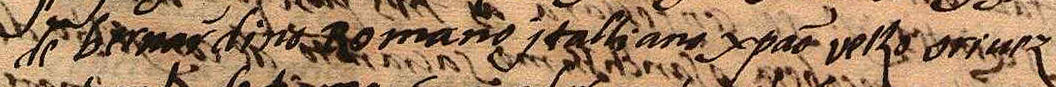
de bernardino Romano jtalliano xpaõ velho oriuez
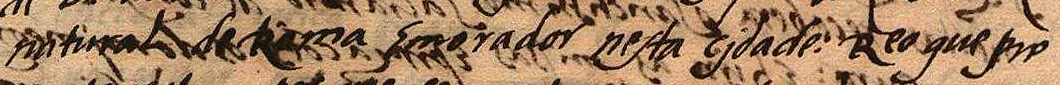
natural de Roma E morador nesta cjdade Reo que pre
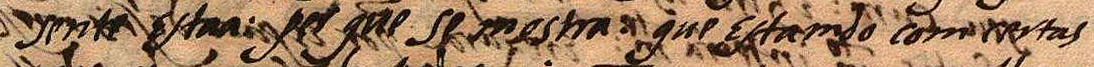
sente Estaa per que se mostra que Estando com certas
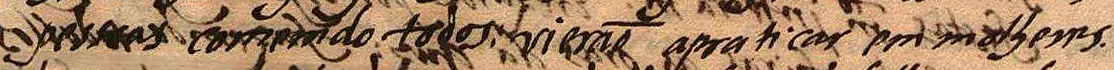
pessoas comemdo todos vieraõ a praticar em molheres
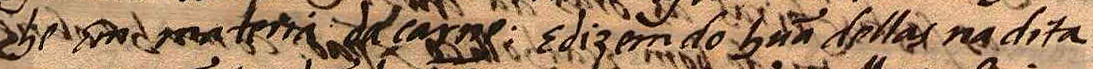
he Em materia da carne: E dizemdo huā dellas na dita
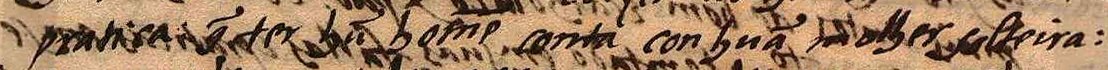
pratica q̄ ter hū hom̄e conta con huā molher solteira:
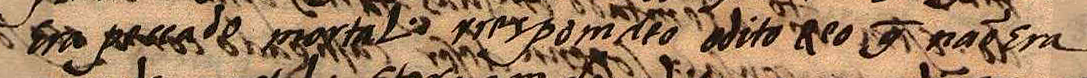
Era peccado mortaL rrespomdeo o dito Reo q̄ naõ Era
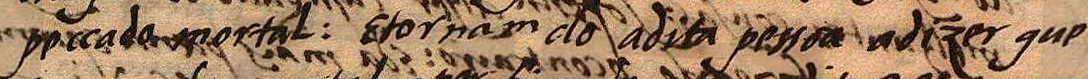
peccado mortaL: E tornamdo a dita pessoa a dizer que
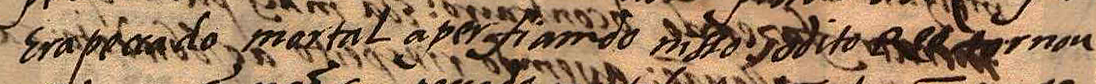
Era peccado mortaL aperfiamdo nisso o dito Reo tornou
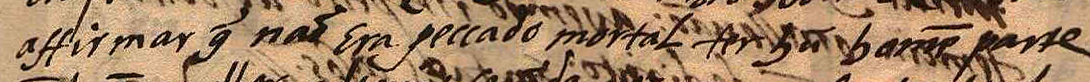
affirmar q̄ naõ Era peccado mortaL ter hū homē parte
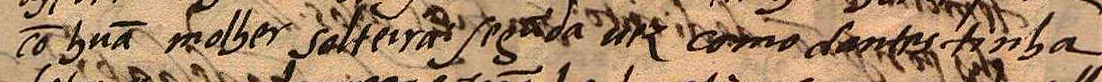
c̄o huā molher solteira segūda uez como dantes tinha
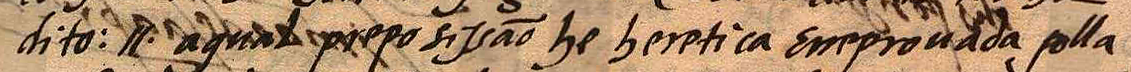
dito //. a qual preposissão he heretica E rreprouada polla
